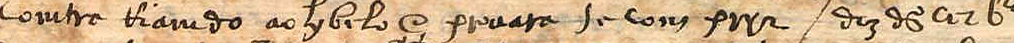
comtraRiamdo ao Lybelo e prouara se compryr / diz dso cervra
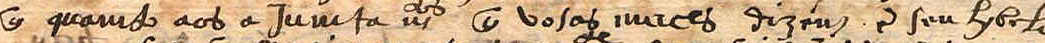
q̄ quamto aos aJumtamtos q̄ vosas merces dizem ē seu Lybelo
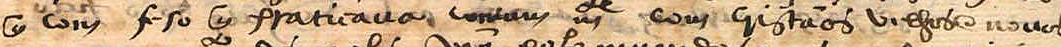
q̄ comfeso q̄ praticaua comummte com cristãos velhos e nouos
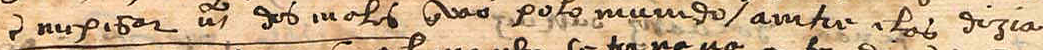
ē me pesar mto dos males q̄ vão polo mumdo / amtre elas dizia
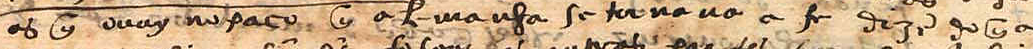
os q̄ ouuy no paco q̄ alemanha se tornaua a fe dizēdo q̄ a
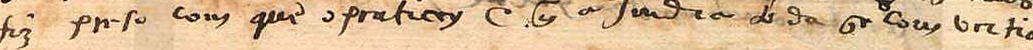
frz̄ preso com quē o praticey e q̄ a Jmdia toda se convertia
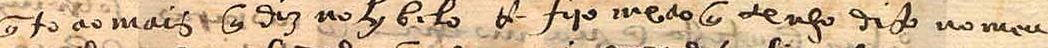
q̄to ao mais q̄ diz no Lybelo Refiro me do q̄ tenho dito no meu
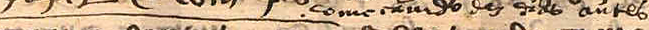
comecamdo des dias antes
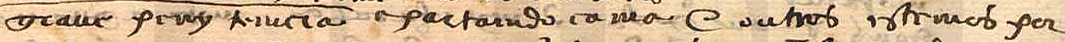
graue penytencia apartamdo cama e outros estemos por
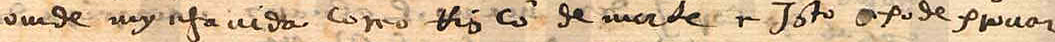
omde mynha uida coreo Risco de morte e Jsto o pode prouar
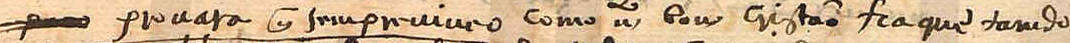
__ prouara q̄ sempre uiueo como mto bom cristão fraquētamdo
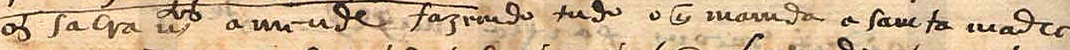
os sacramtos a meude fazemdo tudo o q̄ mamda a samta madre
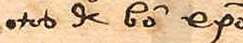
tos de bō xpō
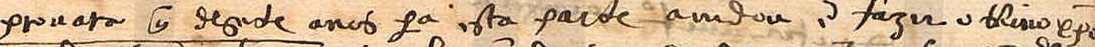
prouara q̄ de sete anos ꝑa esta parte amdou ē fazer o Reino xpō
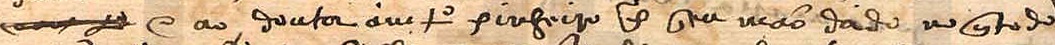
__ e ao doutor amto pinheito p̄ seu maõdado no q̄ todo
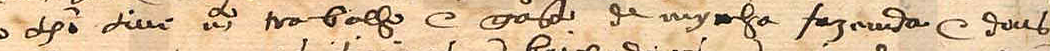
o tpō tiue mto trabalho e gasto de mynha fazemda e dous
